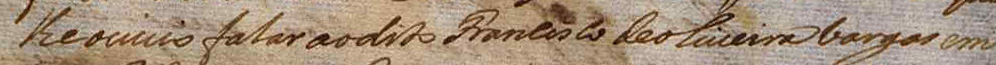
lhe ouuio falar ao dito Francisco de oliueira vargas em
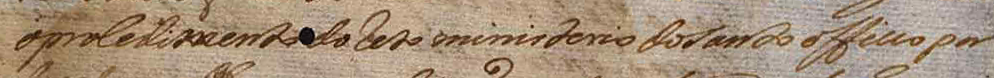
o proCedimento do Reto ministerio do santo officio por
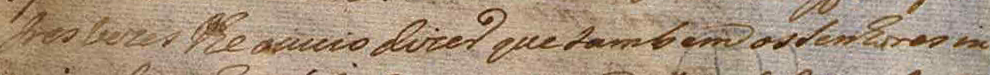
tres vezes lhe ouuio dizer que tambem os senhores in
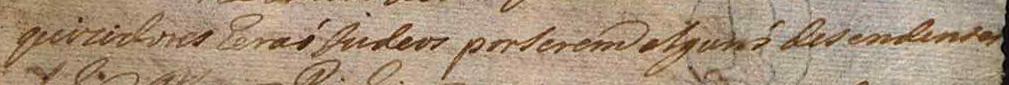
quizidores heraõ Iudeos por serem alguns desendentes
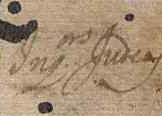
Inq.res Judeos
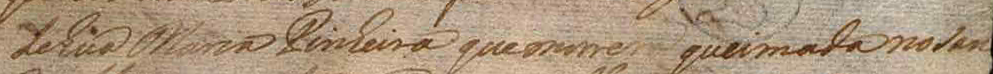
de hua Maria Pinheira que morrera queimada no san
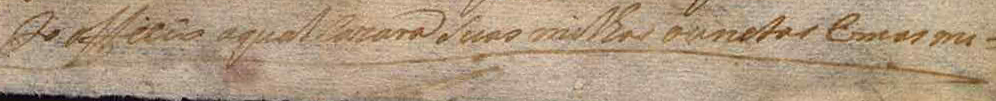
to officio a qual Cazara suas milhas ou netas Com as mi
